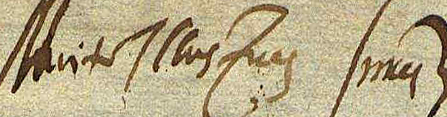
Muito Illustres Snrēs
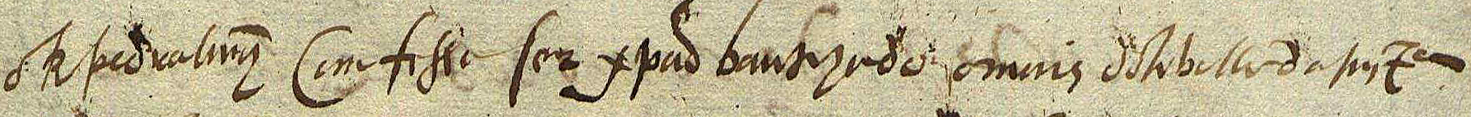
o R pedralur̄z Comfessa ser xpaõ bautizado o mais do libello da justa.
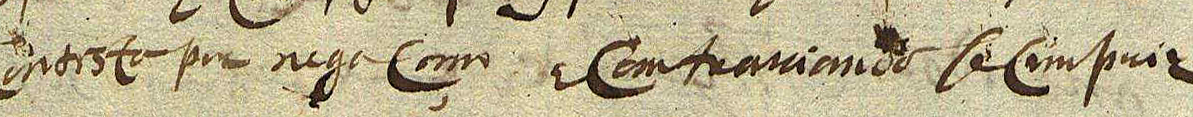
Contesta por negaÇam e Comtrariando se Comprir
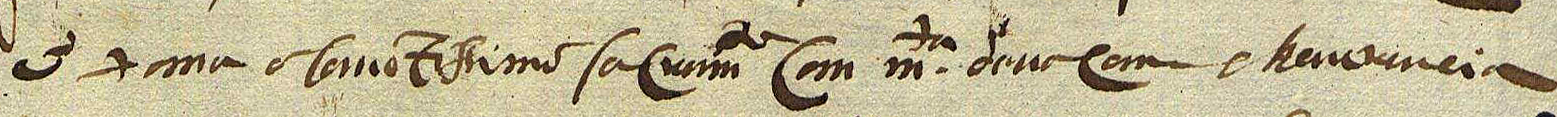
& toma o sanctissimo saCramto Com mta. deuaCam e Reuerencia
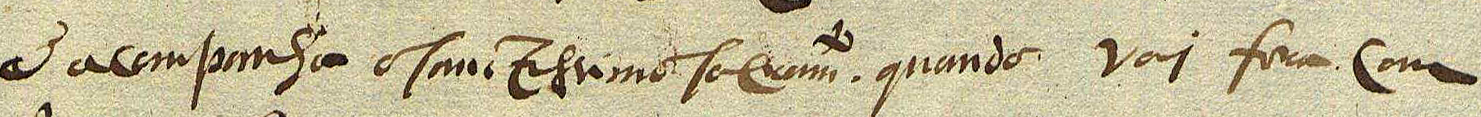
& acompanha o sanctissimo saCramto. quando vai fora Com
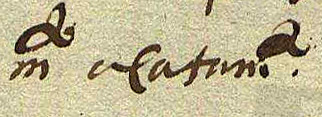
mto aCatamto.
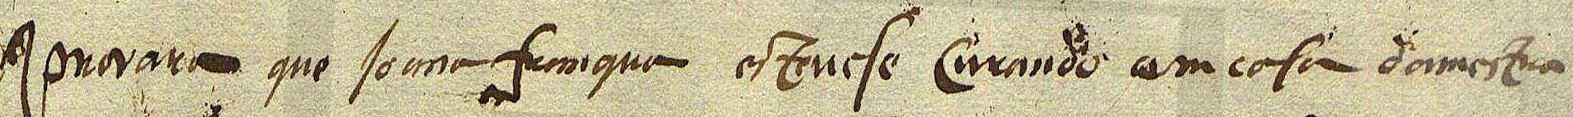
Provara que Joana framqua esteue se Curando em casa da mestra
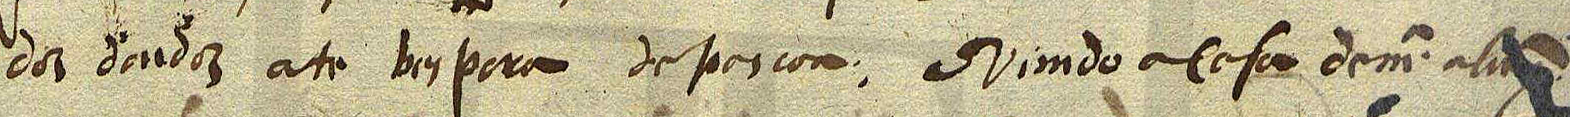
dos doudos ate vespora de pascoa, & vimdo a Casa de ma. alu_
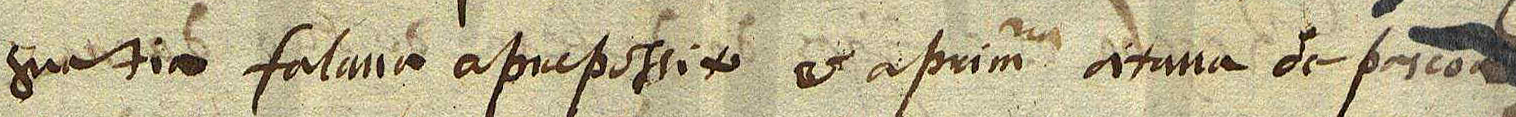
sua tia falaua a prepossito & a primra oitaua de pascoa
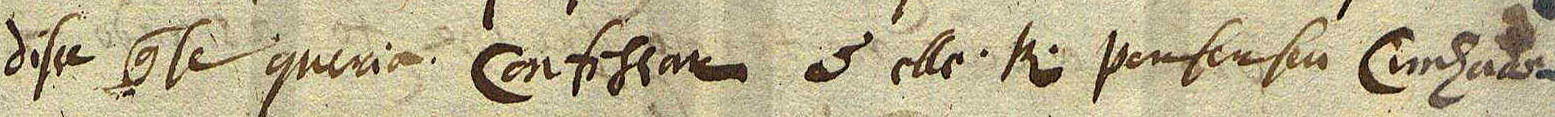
disse q̄ se queria Confessar & elle .R. por ser seu Cunhado
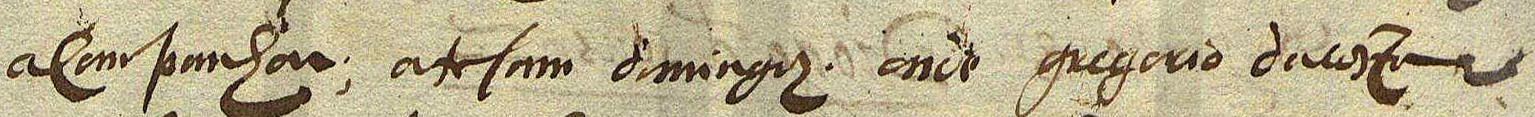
aCompanhou; ate sam domingos. onde gregorio da costa &
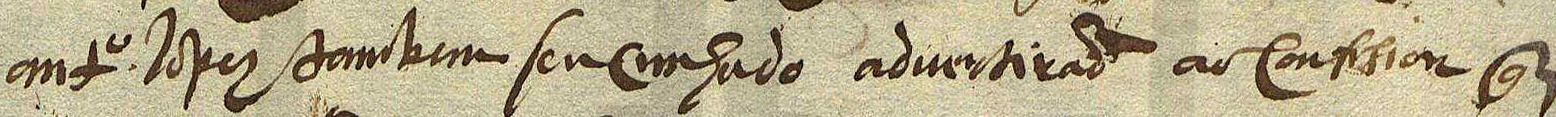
anto lopes tambem seu Cunhado aduertiraõ ao Confessor q̄
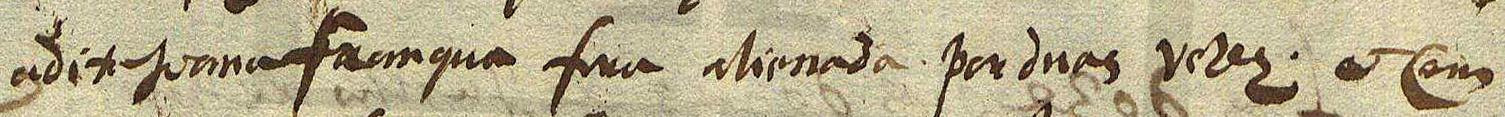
a dita joana franqua fora alienada por duas vezes. & Com
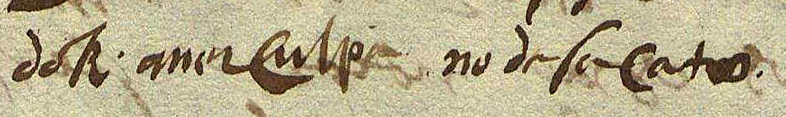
do R. auer Culpa no desaCato.
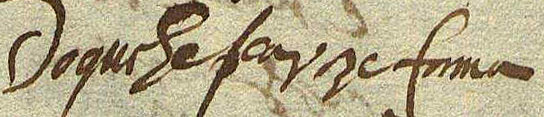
Do que he pca voz e fama
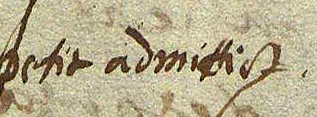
petit admittiō
